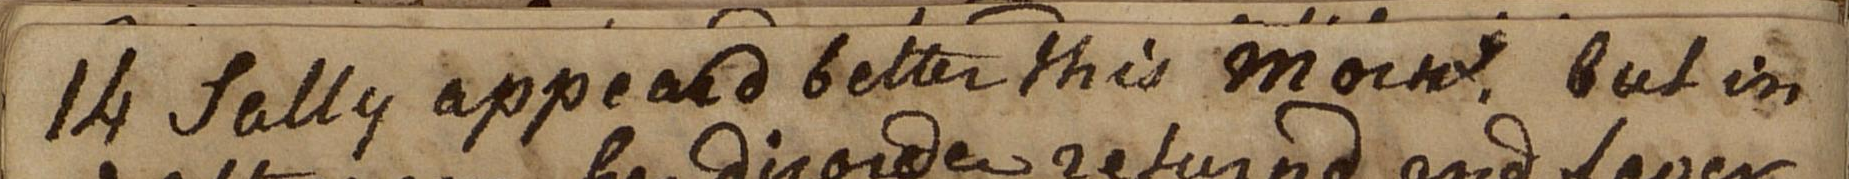14 Sally appeard better this morn.^g but in
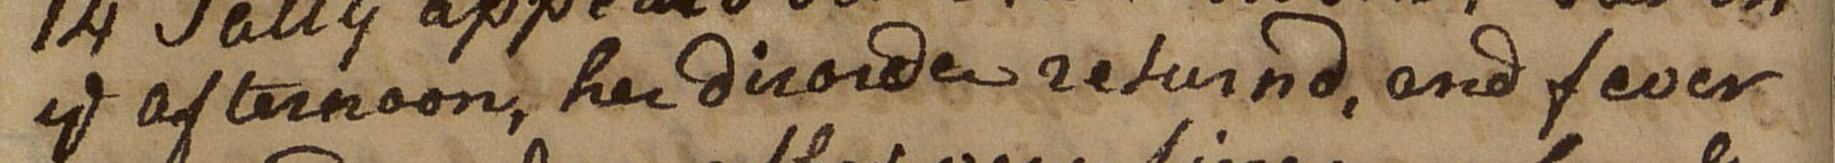y^e afternoon, her dirorder returnd, and fever
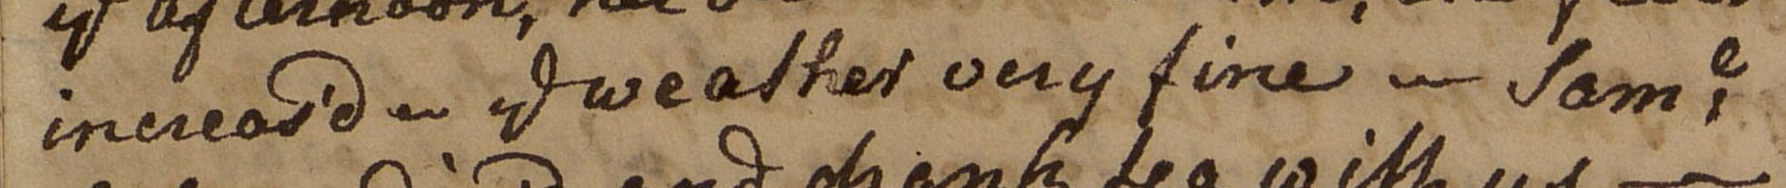increas'd- y^e weather very fine- Sam.^l
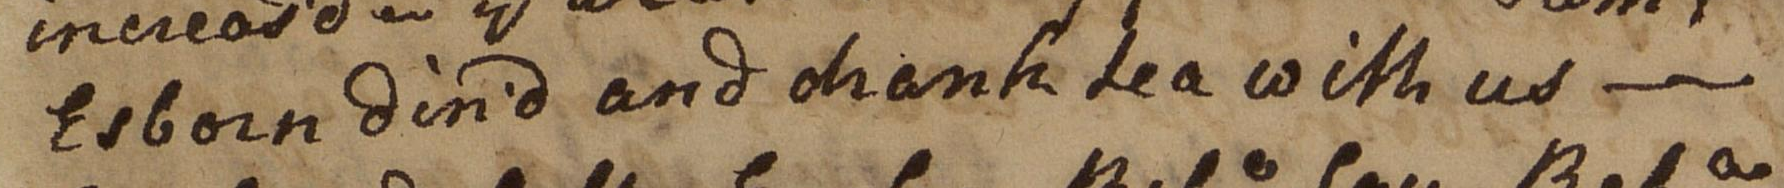Esborn din'd and drank tea with us-
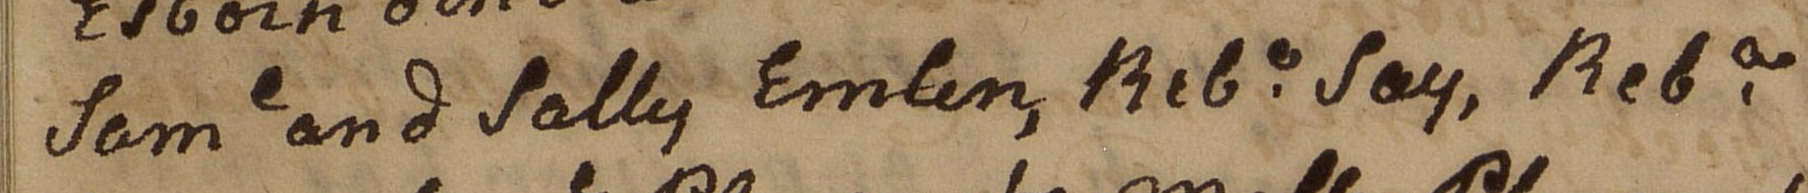Sam^l and Sally Emlen, Reb.^e Say, Reb^a.
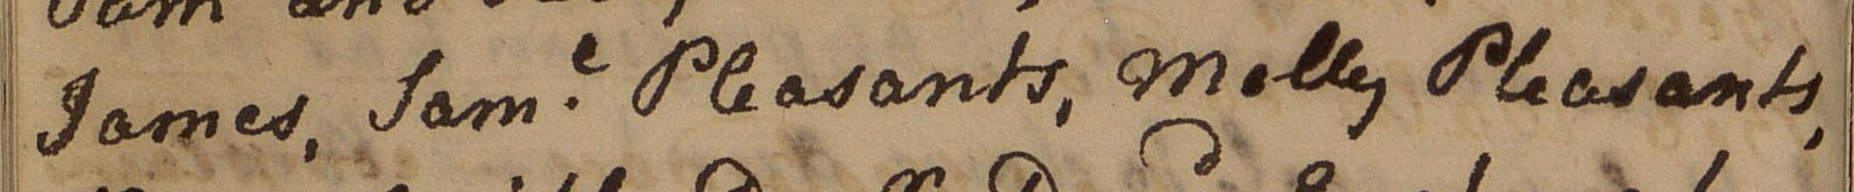James, Sam^l. Pleasants, Molly Pleasants,
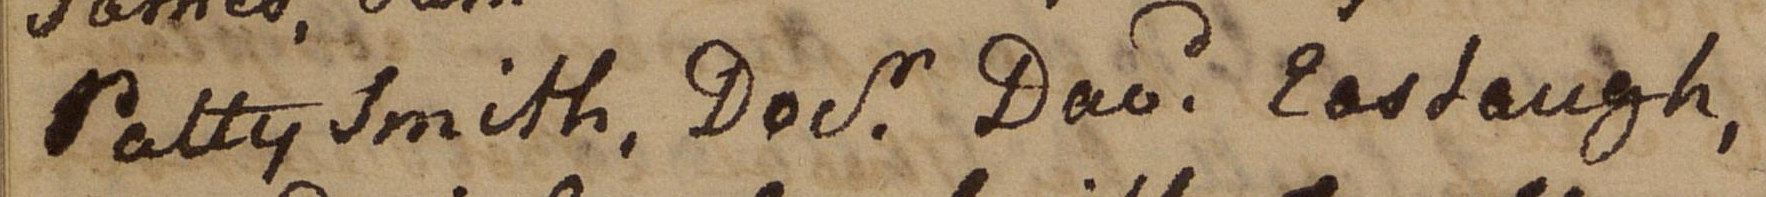Patty Smith, Doc^r. Dav.^d Eastaugh,
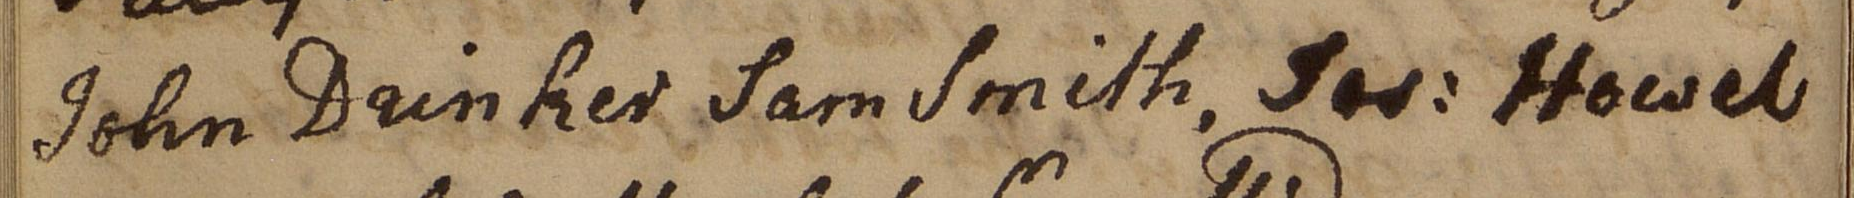John Drinker Sam Smith, Jos: Howel
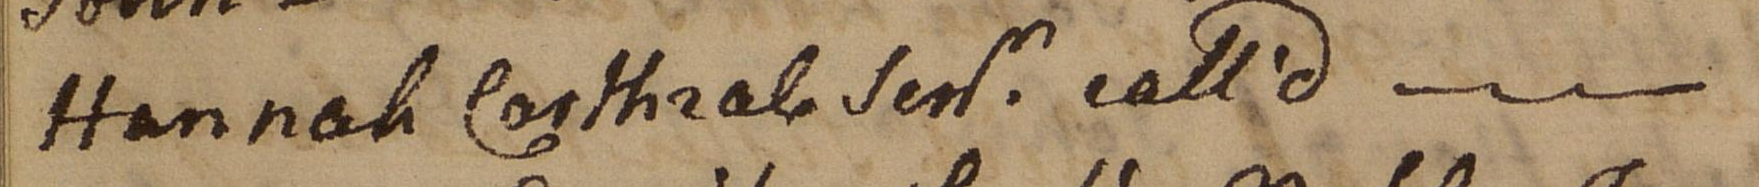Hannah Carthral Sen^r. call'd-
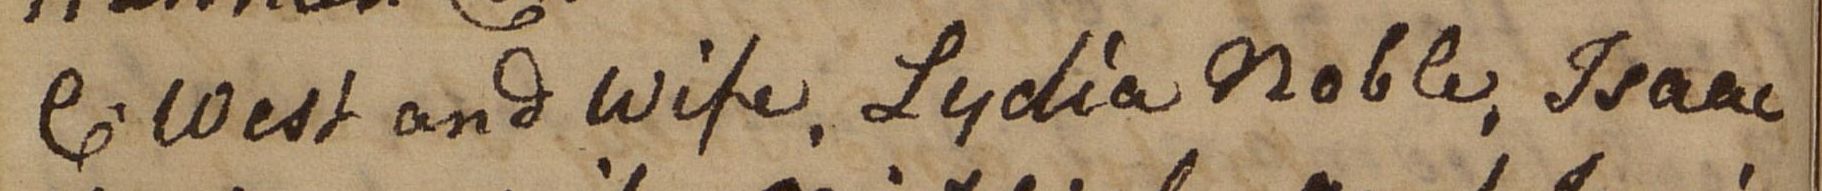C. West and wife, Lydia Noble, Isaac
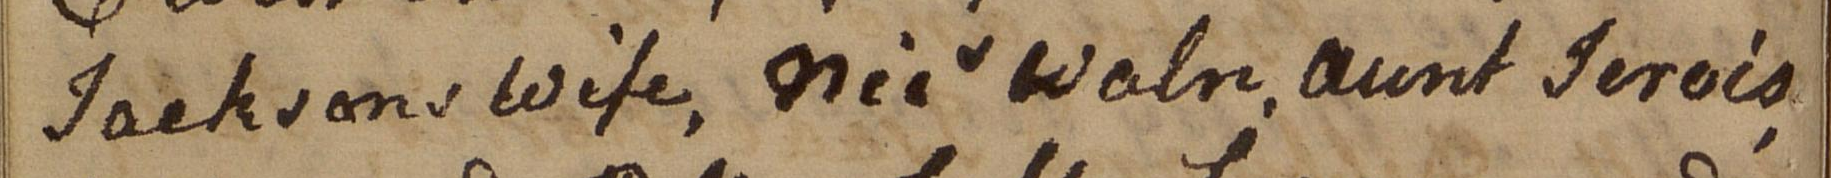Jacksons wife, Nic.^s Waln, Aunt Jervis
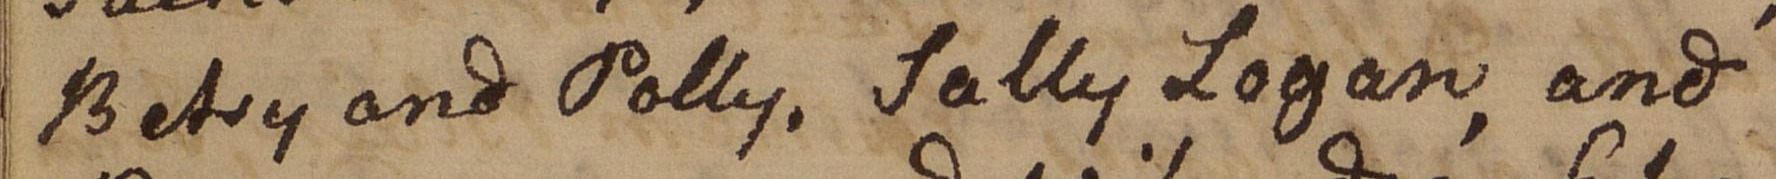Betsy and Polly, Sally Logan, and
